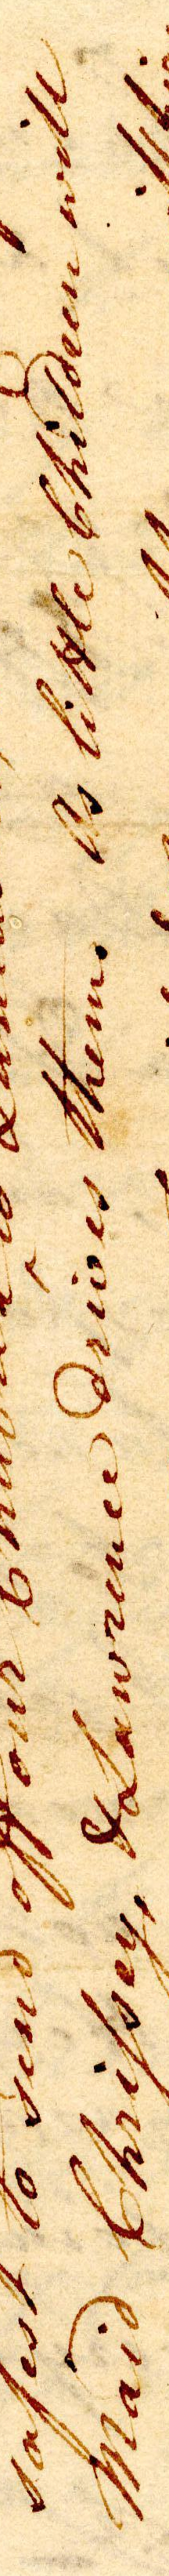maid Chrissey, & Lawrence drives them. As little Children will
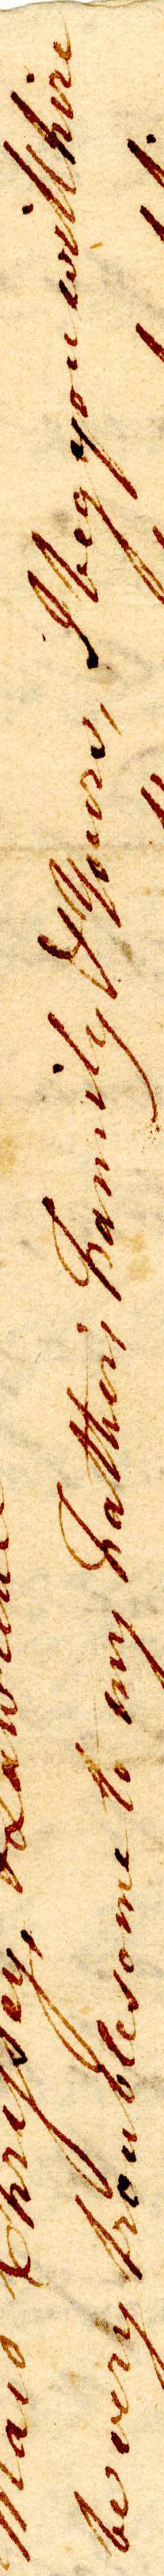be very troublesome to my Father's Family & Yours, I beg you will hire
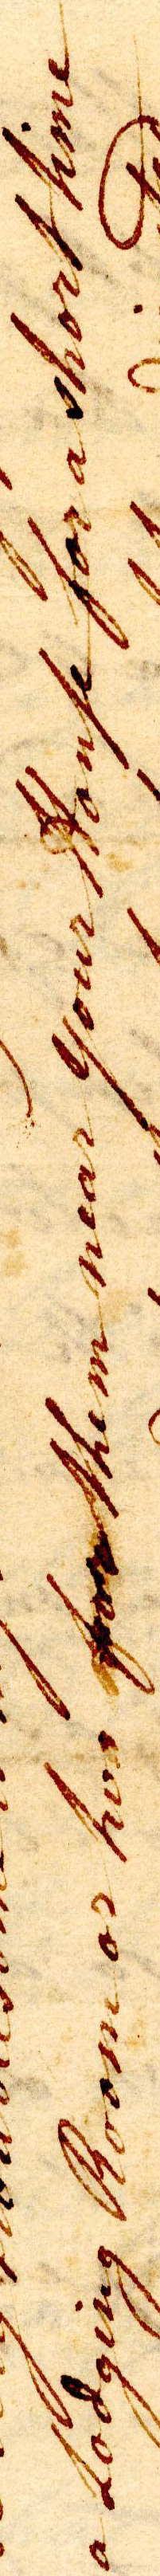a Lodging Room or two for them near your House for a short time
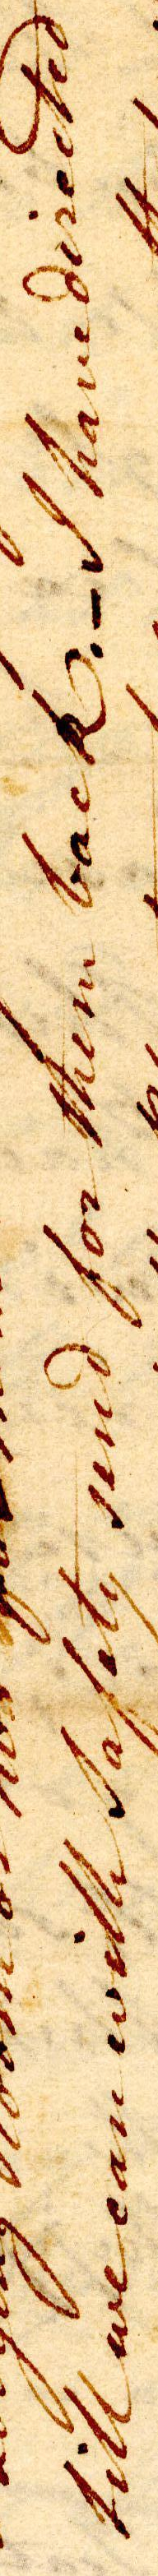till we can with Safety send for them back.- I have directed
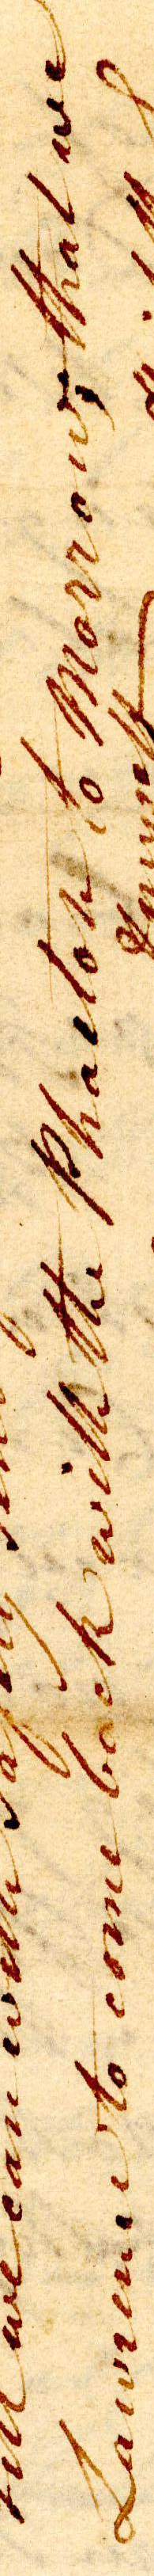Lawrence to come back with the Phaeton to morrow; that we
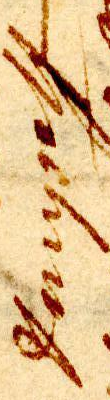& myself
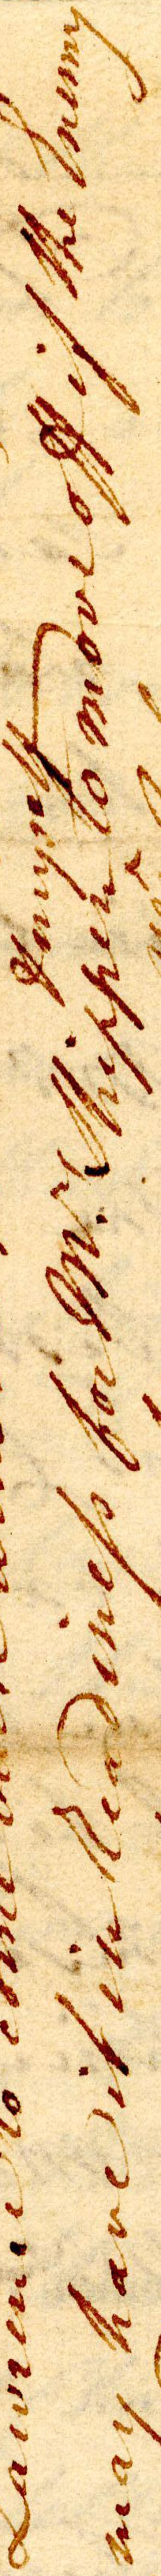may have it in readiness for M^rs. Shippen ^ to move off if the Enemy
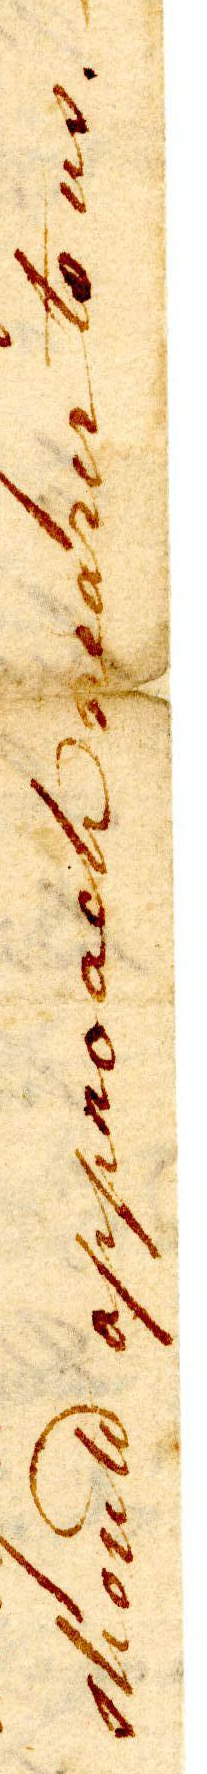should approach nearer to us.
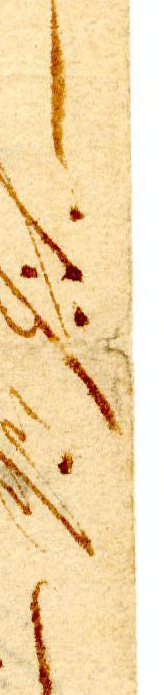-Y^rs. J: S.-
